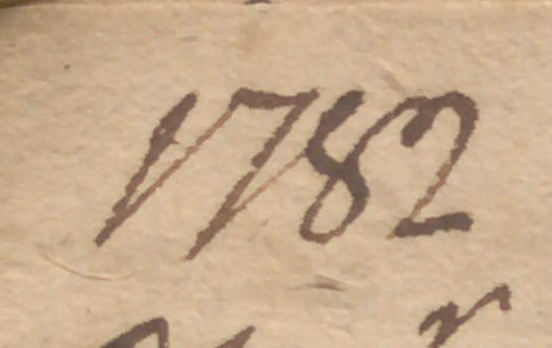1782
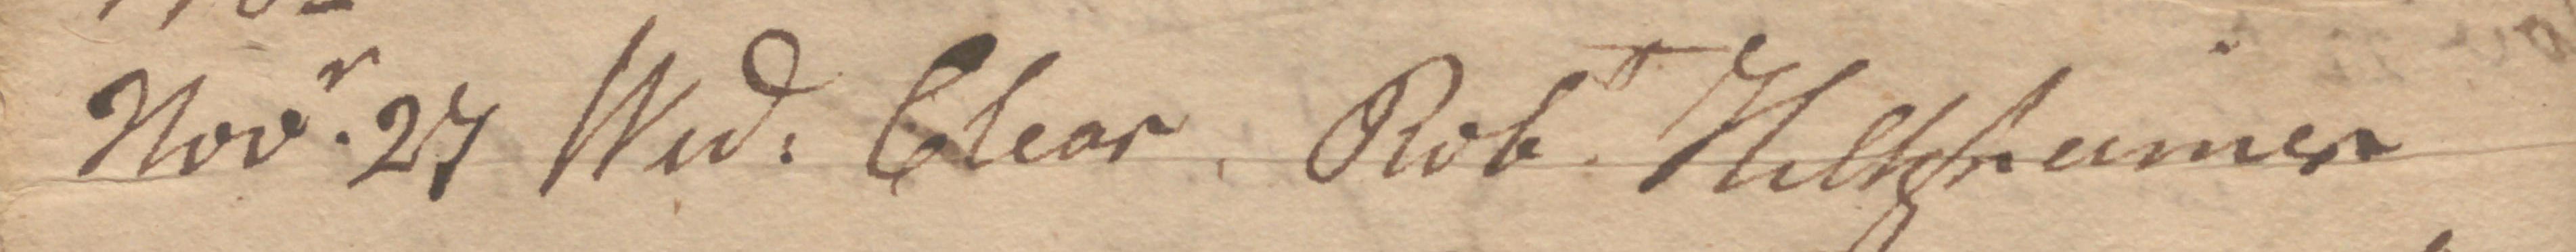Nov^r. 27 Wed. Clear. Rob^t. Hiltzheimer
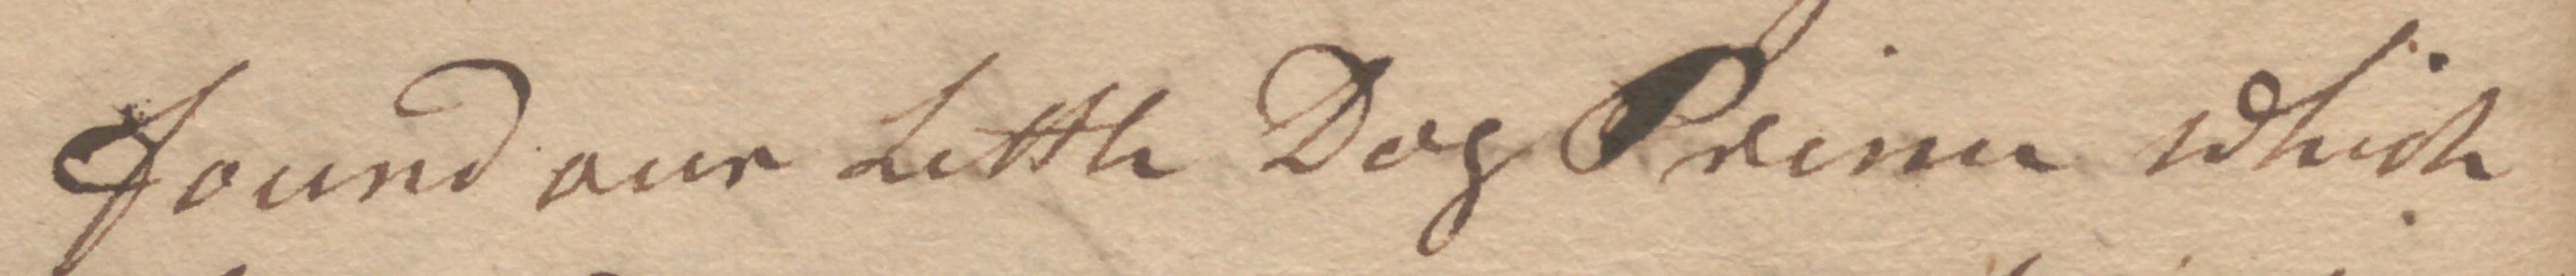found our Little Dog Prince which
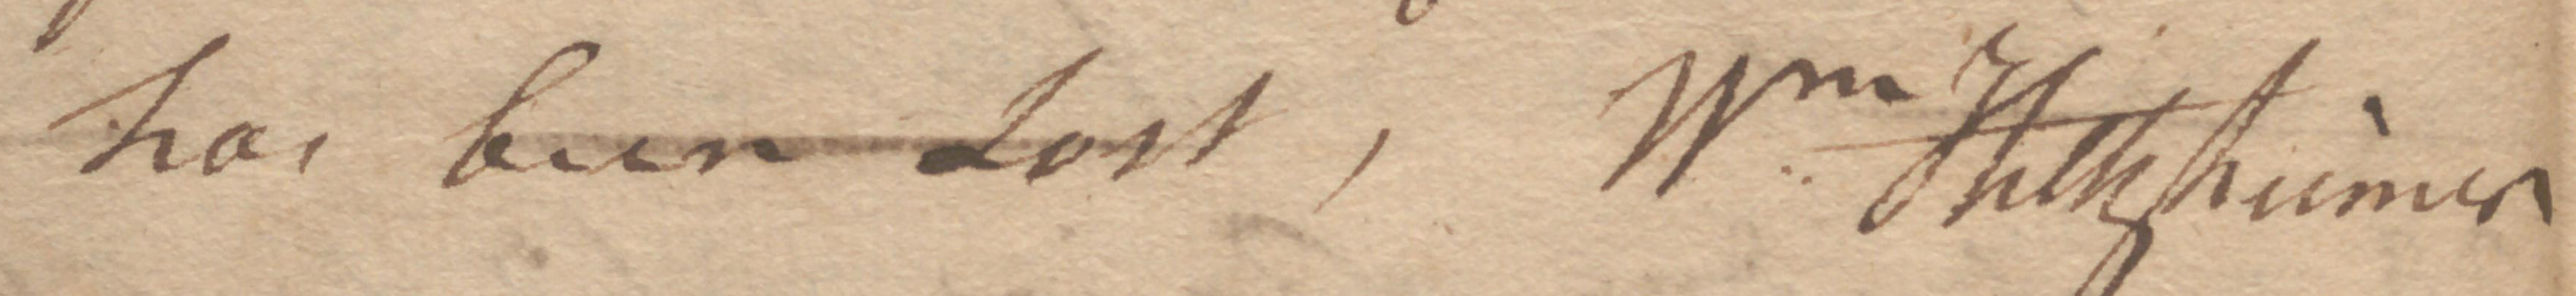has been Lost, W^m. Hiltzheimer
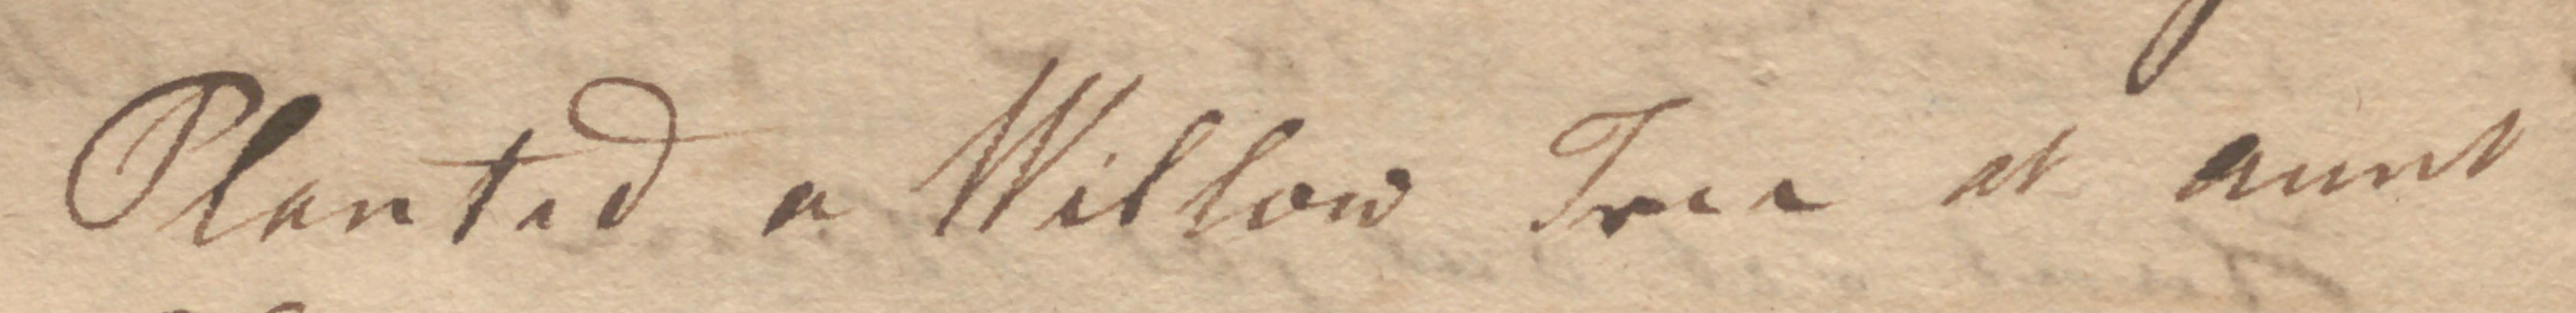Planted a Willow Tree at aunt
